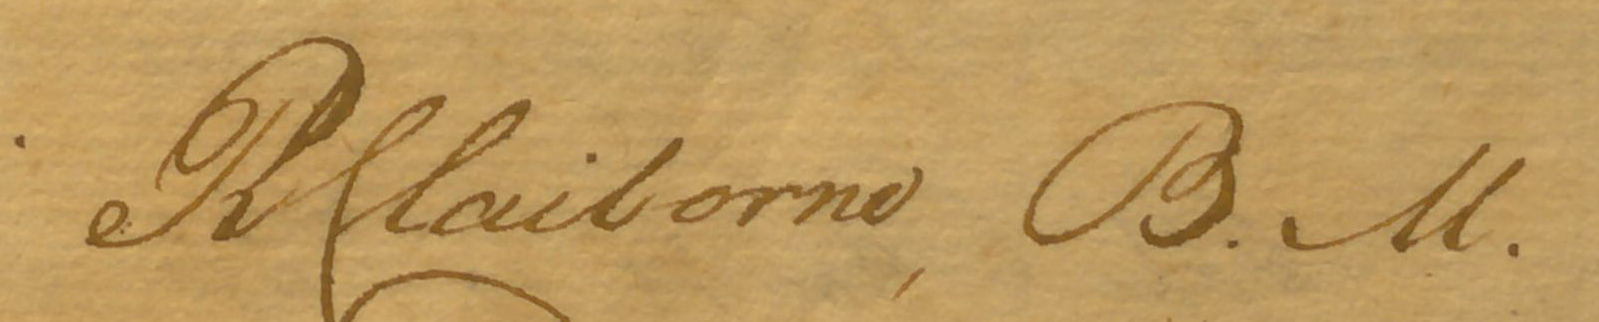R Claiborne, B. M.
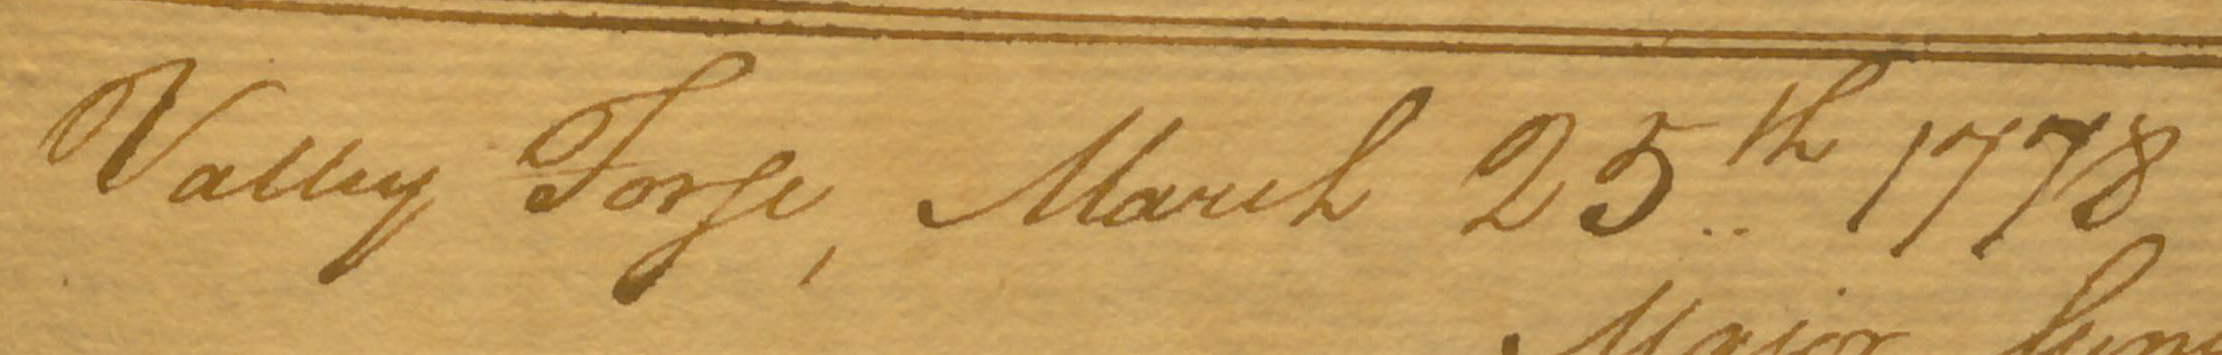Valley Forge, March 25^th. 1778
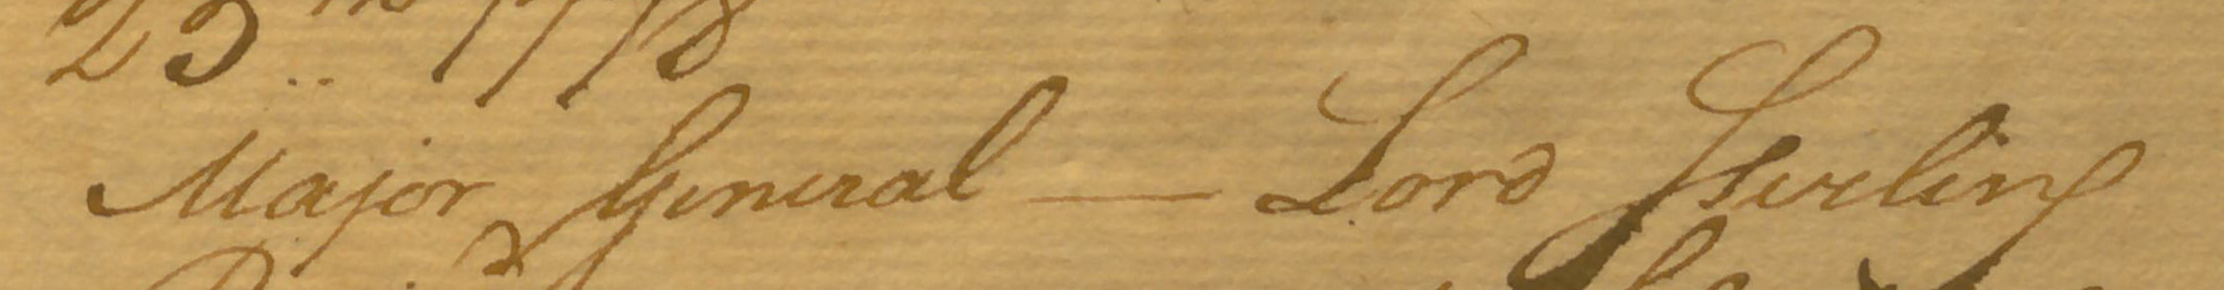Major General- Lord Sterling
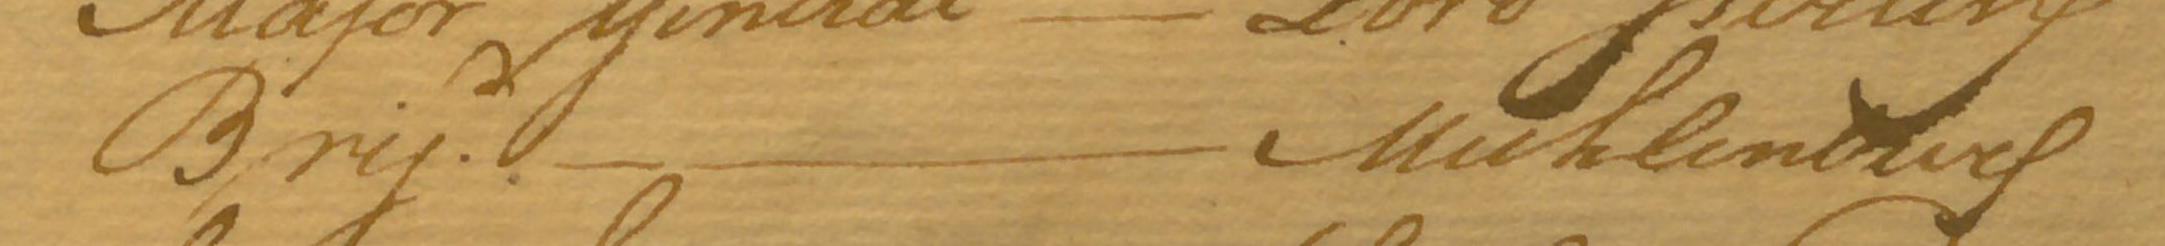Brig^r.- Muhlenburg
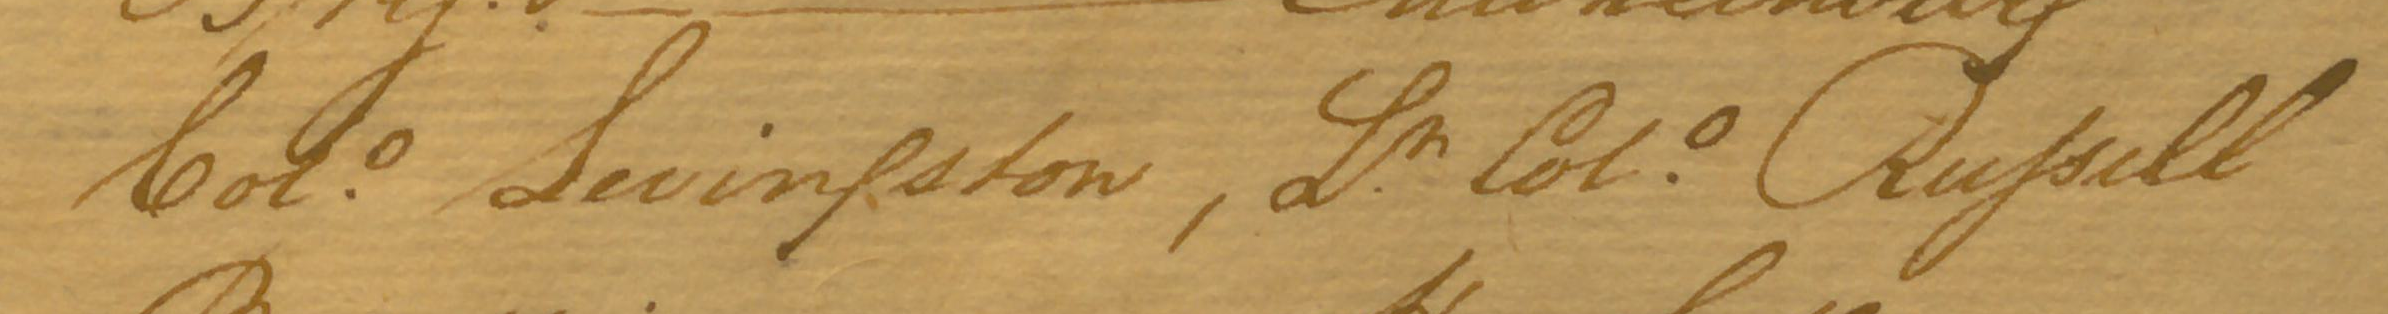Col^o. Levingston, L^t. Col^o. Russell
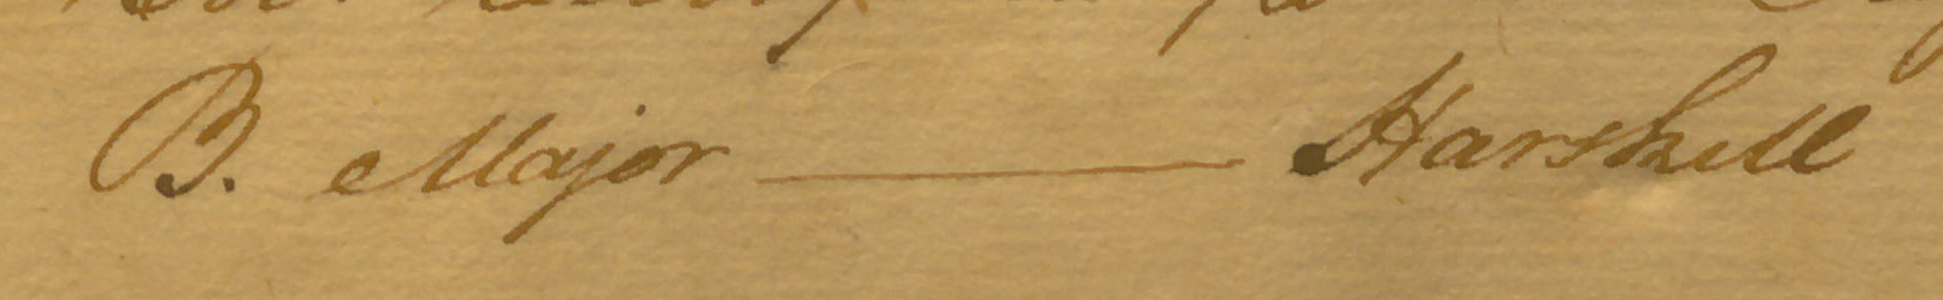B. Major- Harskill
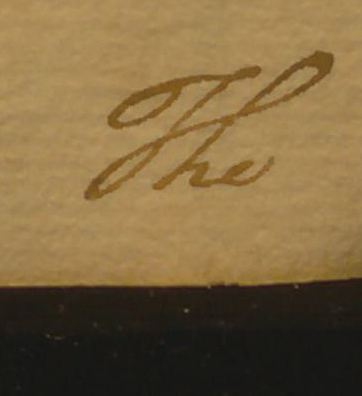The
